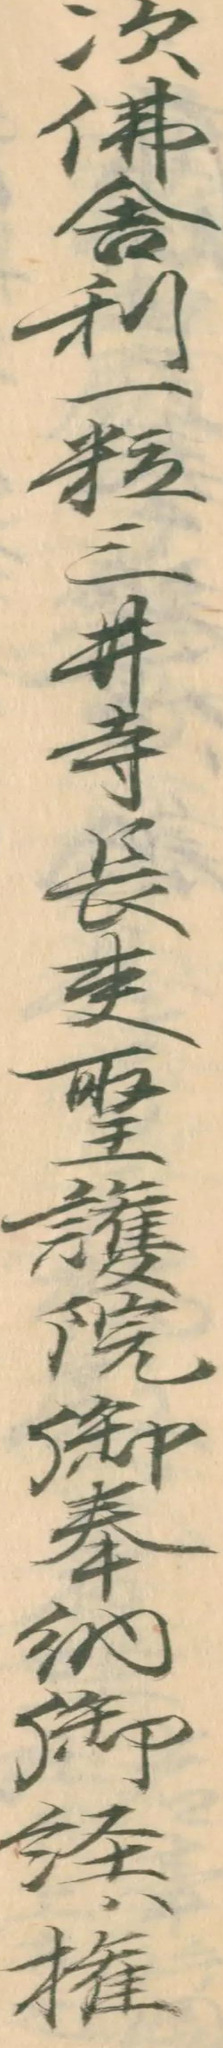次仏舎利一粒三井寺長吏聖護院御奉納御経ハ権
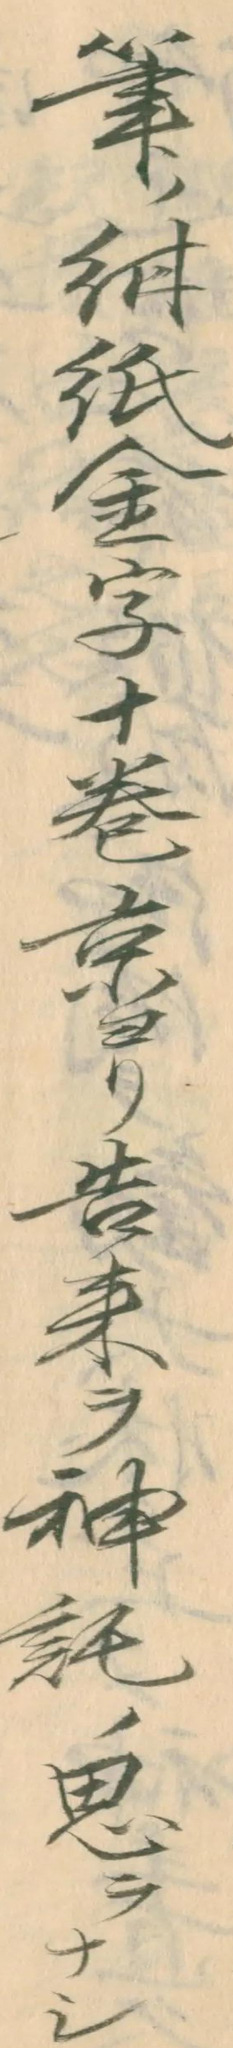筆ノ紺紙金字十巻京ヨリ告来ヲ神託ノ思ヲナシ
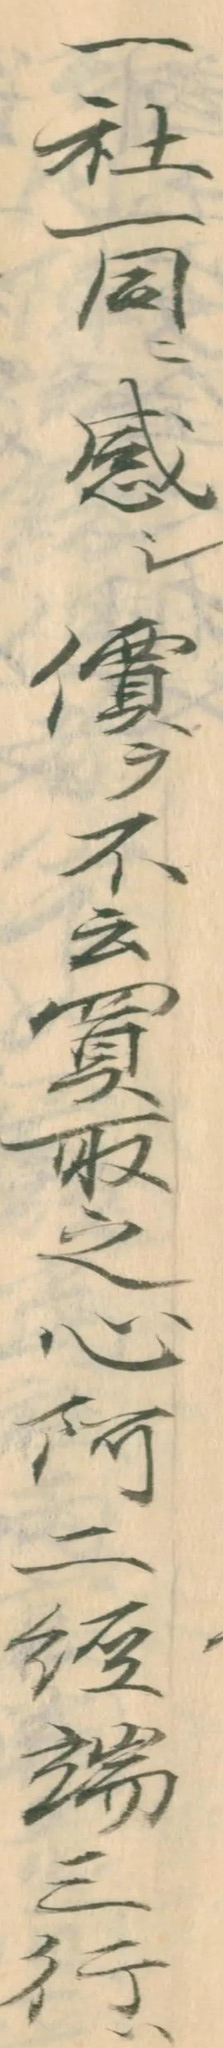一社一同ニ感シ価ヲ不云買取之心阿二経端三行ハ
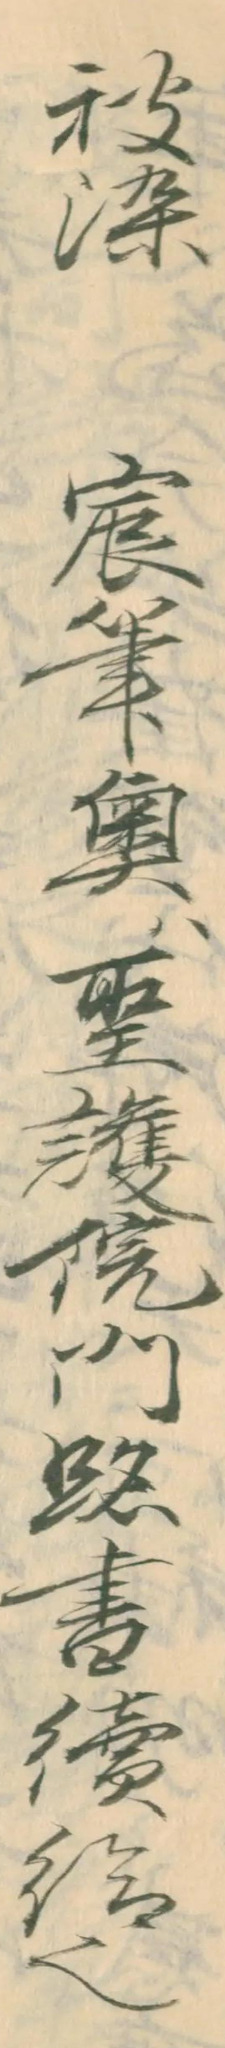被染宸筆奥ハ聖護院門跡書続給也
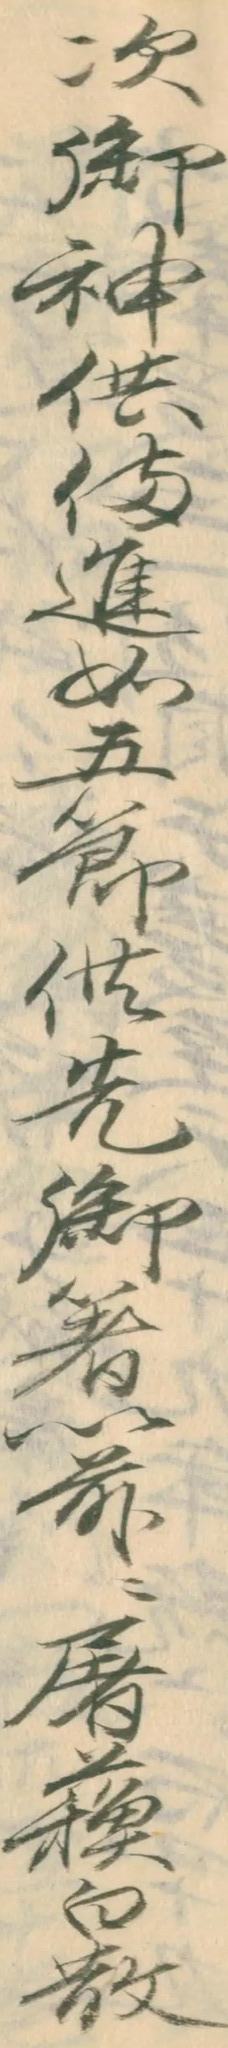次御神供備進如五節供先御箸以前ニ屠蘇白散
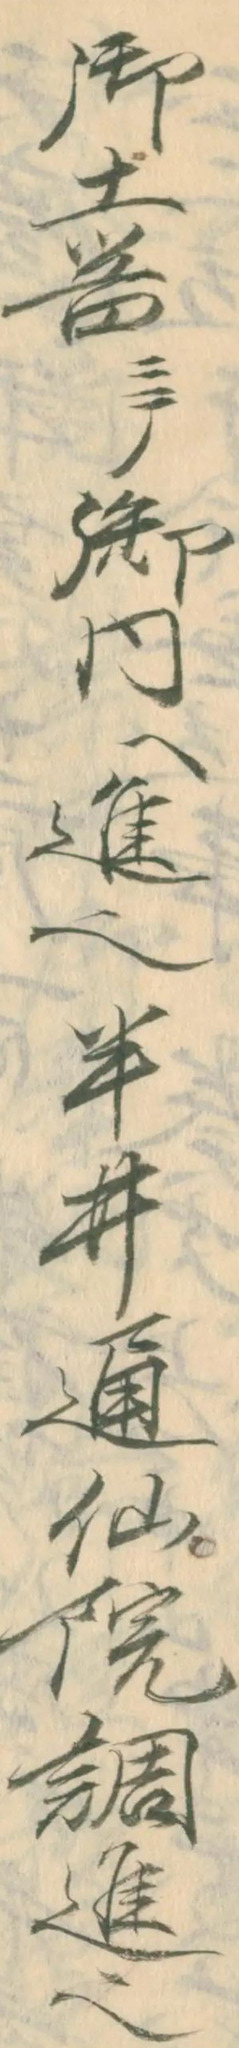御土器ニテ御内へ進也半井通仙院調進也
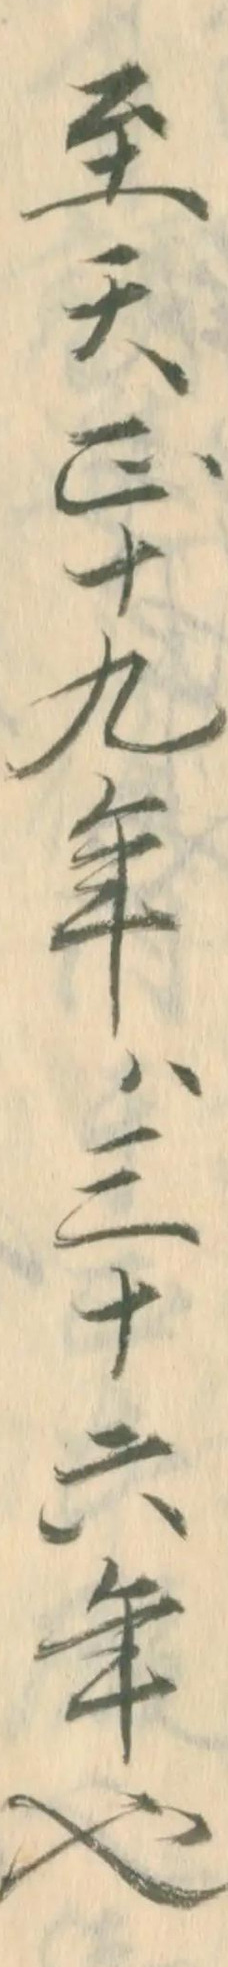至天正十九年ハ三十六年也
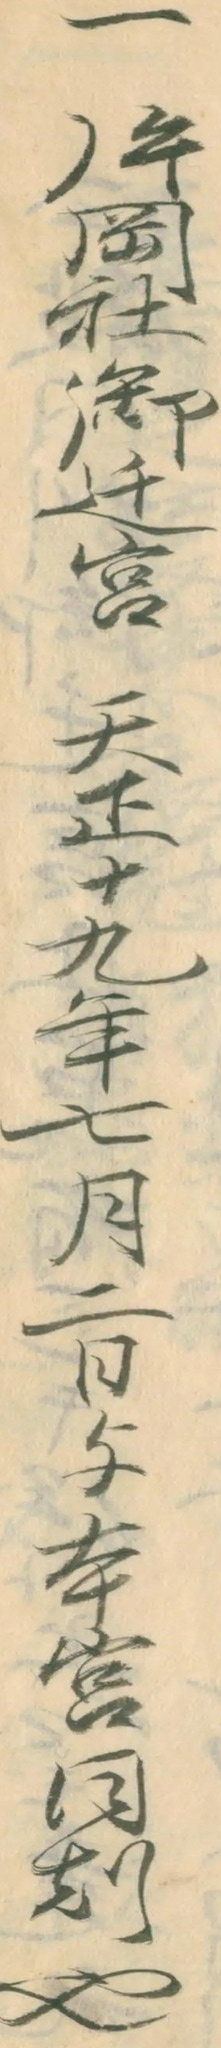一片岡社御遷宮天正十九年七月二日与本宮同刻也

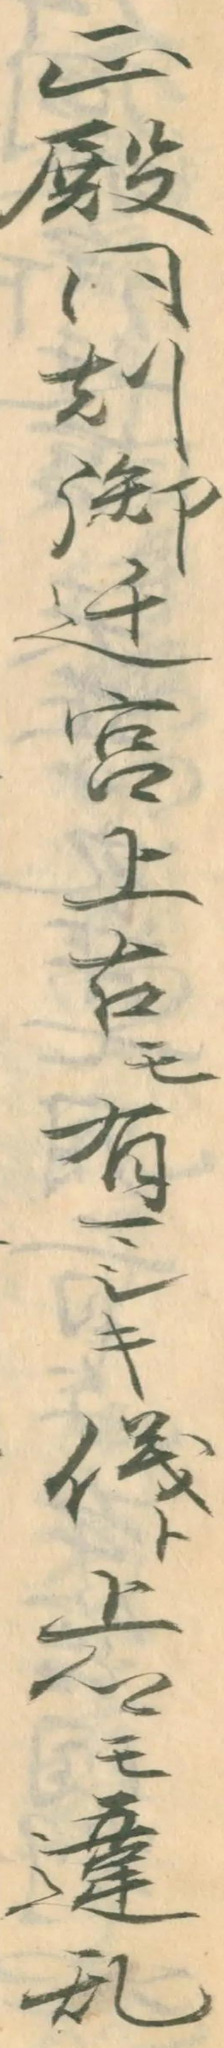正殿同刻御迁宮上古モ有マシキ儀ト上卿モ違乱
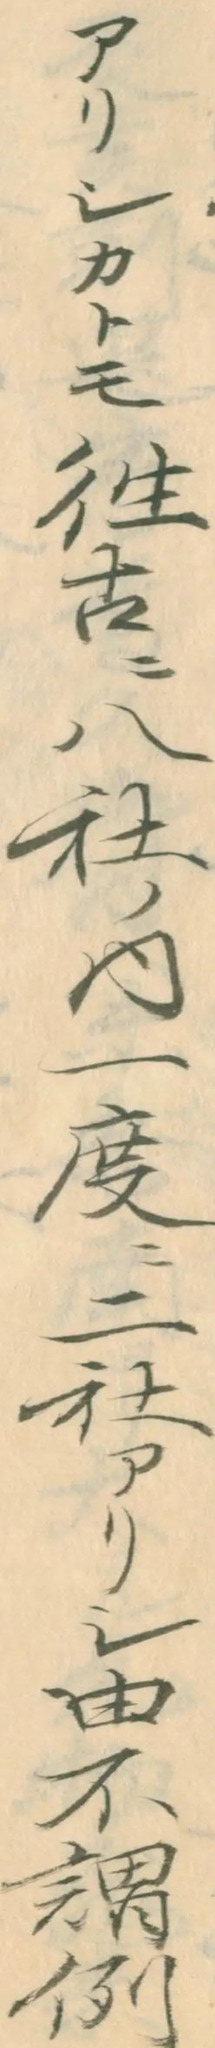アリシカトモ往古ニ八社ノ内一度ニ二社アリシ由不謂例
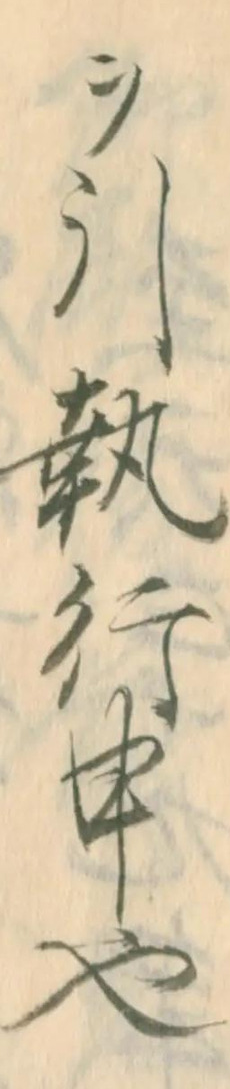ヲ引執行申也
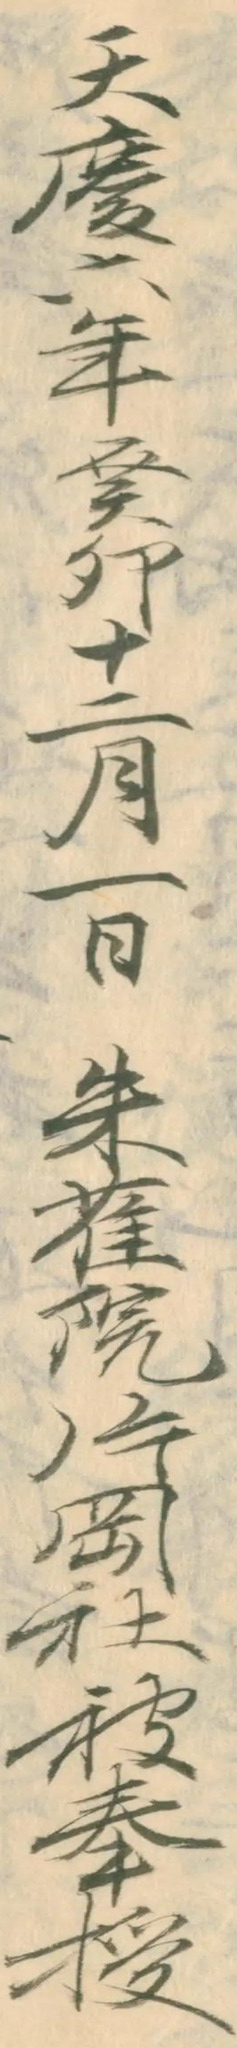天慶六年癸卯十二月一日朱雀院片岡社被奉授
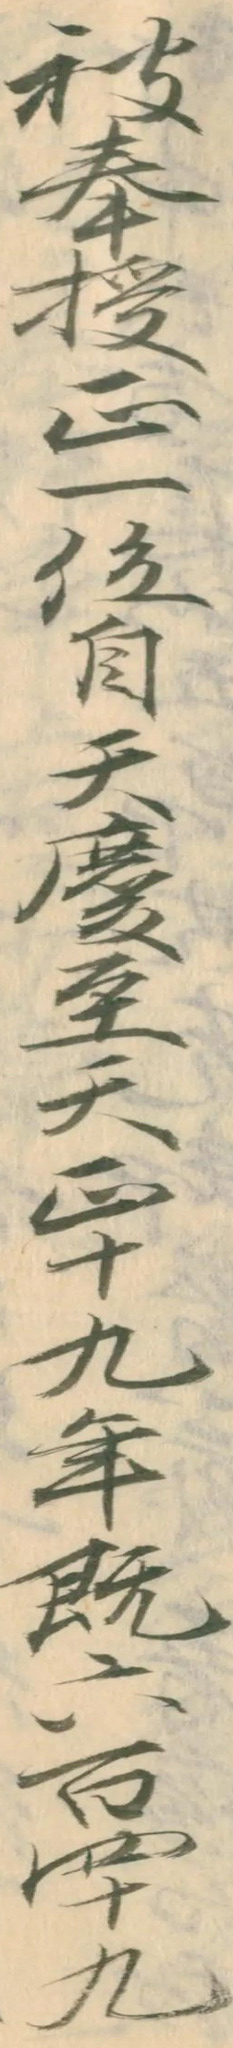被奉授正一位自天慶至天正十九年既六百四十九
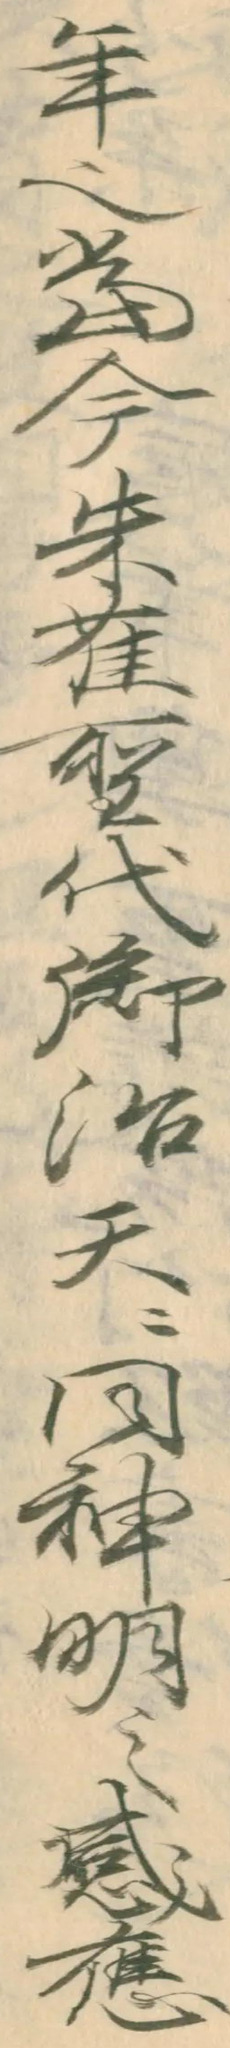年也当今朱雀聖代御治天ニ同神明之感応
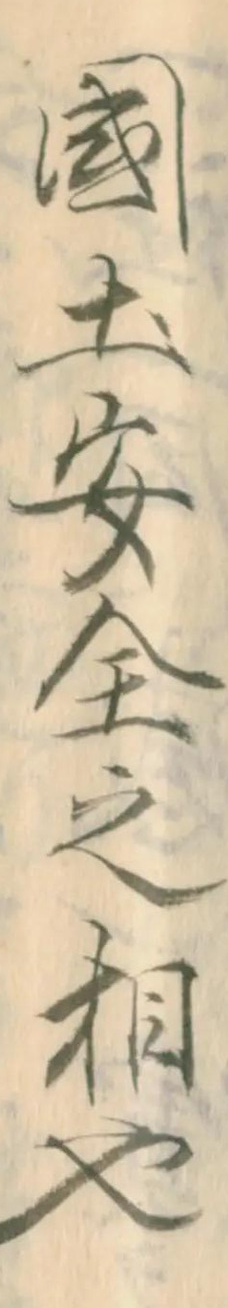国土安全之相也
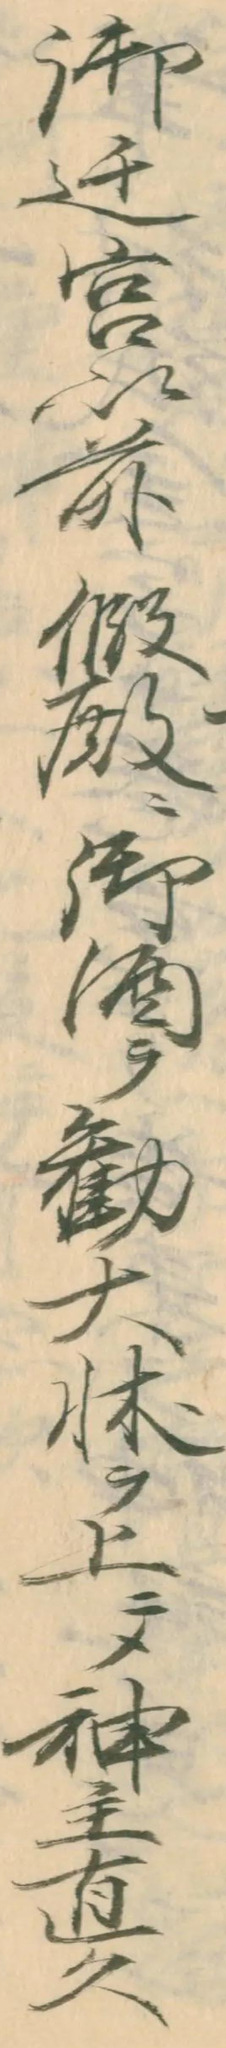御遷宮以前仮殿ニ御酒ヲ勧大状ヲ上ニシテ神主直久
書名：賀茂社記録. 第15冊
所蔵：国立国会図書館 National Diet Library, JAPAN
